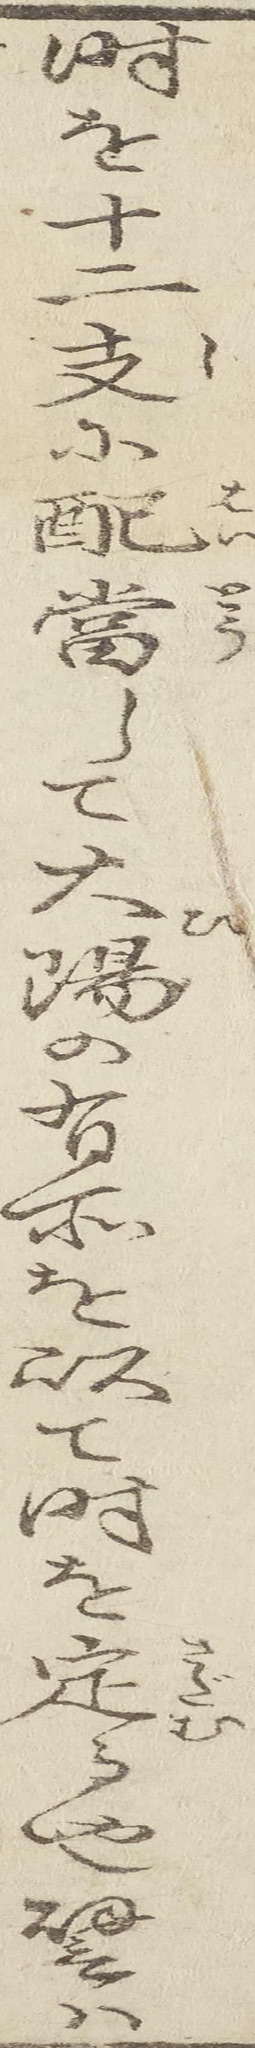時を十二支に配当して大陽の有所を以て時を定る也譬は
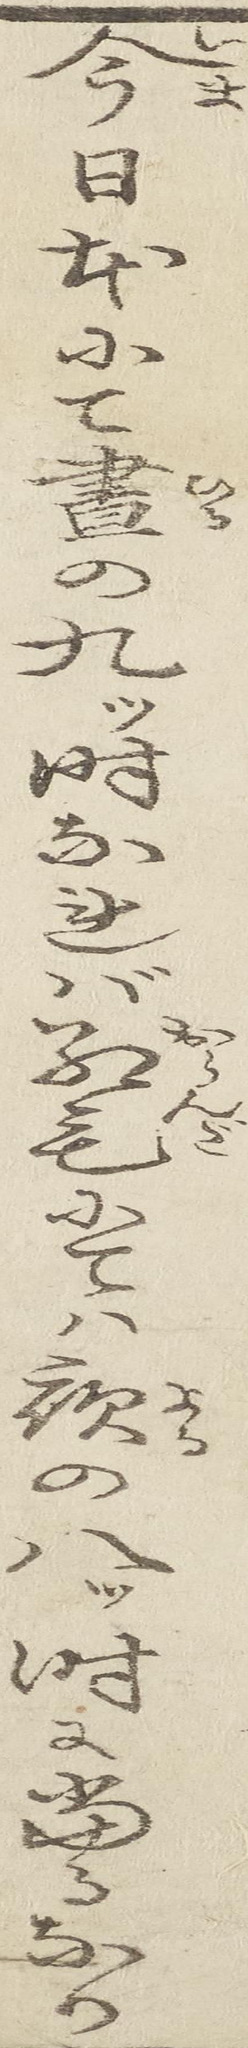今日本にて昼の九ツ時なれば紅毛にては夜の八ツ時に当るなり
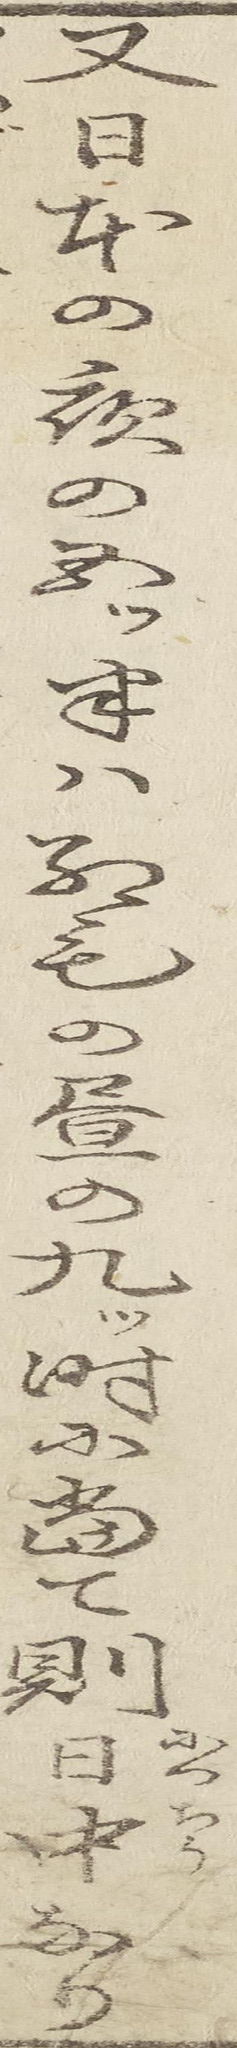又日本の夜の五ツ半は紅毛の昼の九ツ時に当て則日中なり
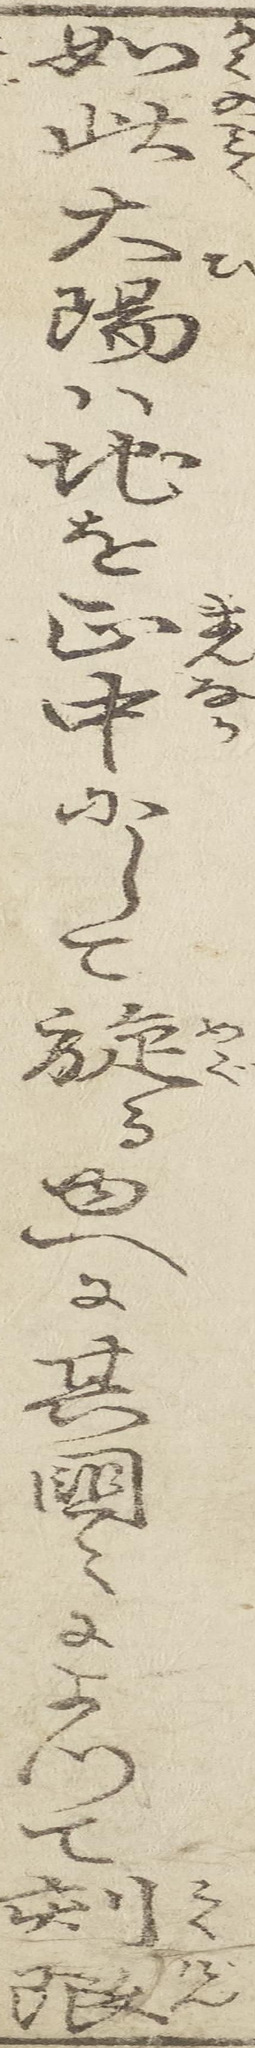如此大陽は地を正中にして旋るゆへに其国々によつて刻限
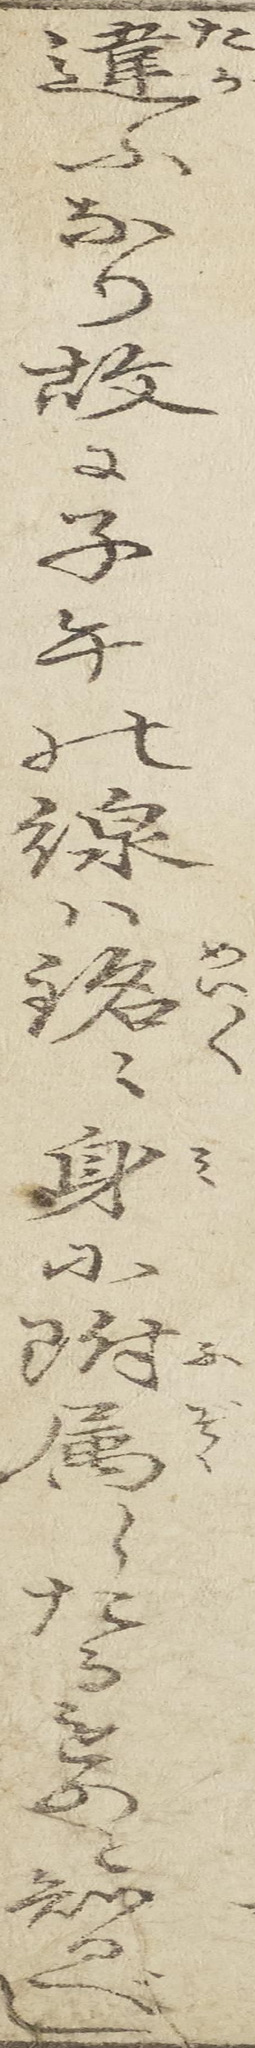違ふなり故に子午線は銘々身に附属したるものと知るべし

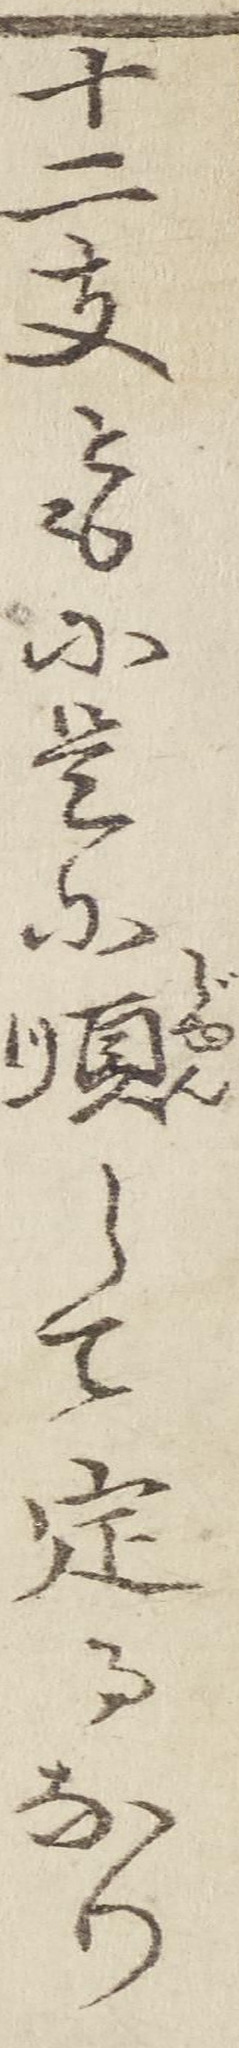十二支ともに是に順して定るなり
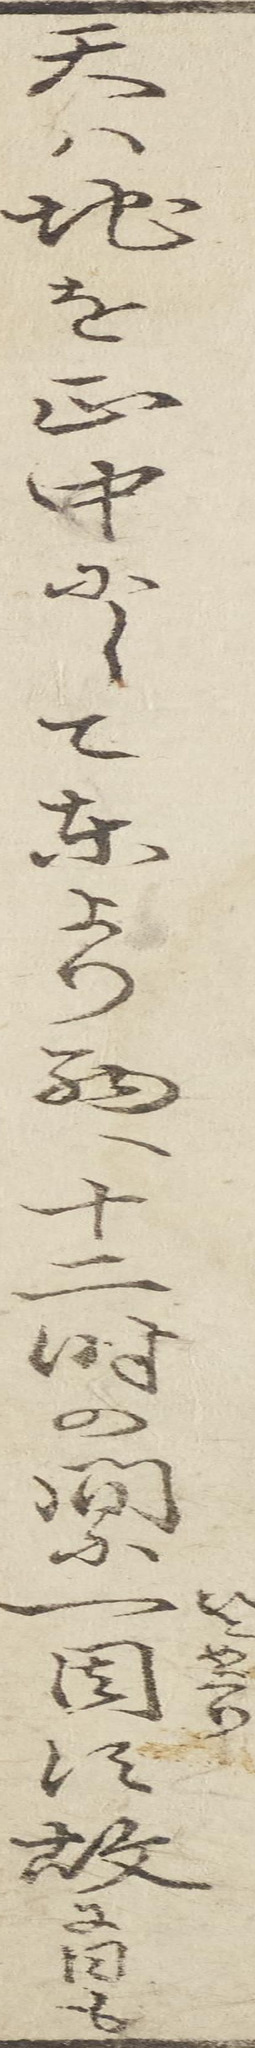天は地を正中にして東より西へ十二時の間に一周す故に日も
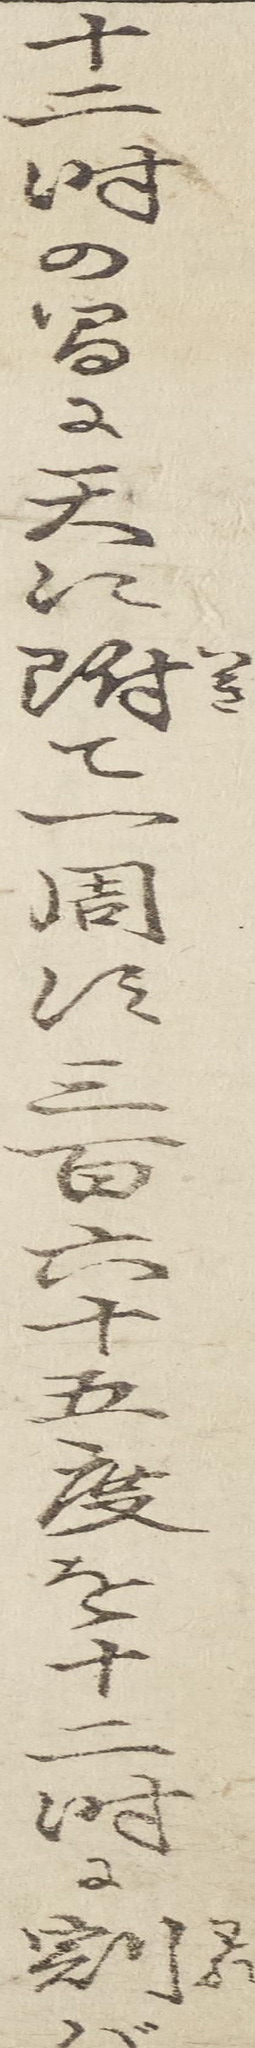十二時の間に天に附て一周す三百六十五度を十二時に割ば
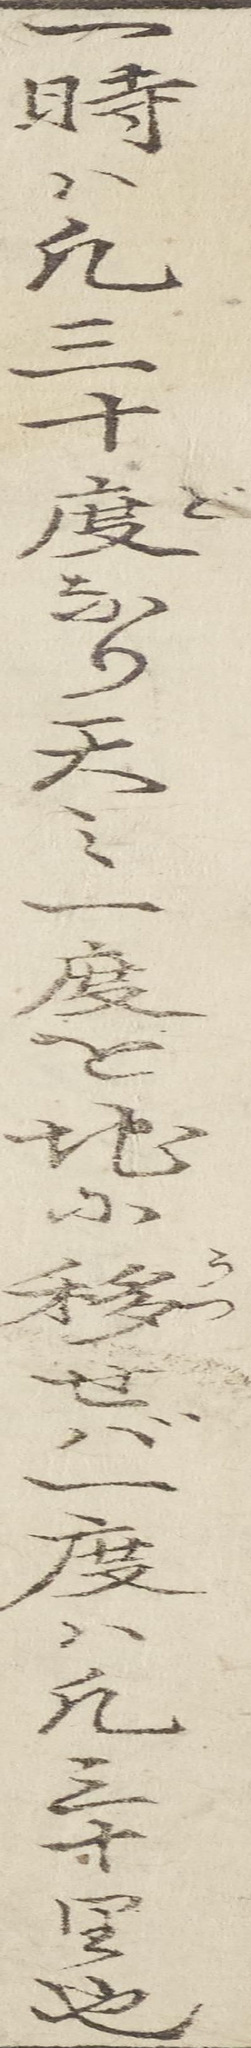一時は凡三十度なり天之一度を北に移せば一度は凡三十里也
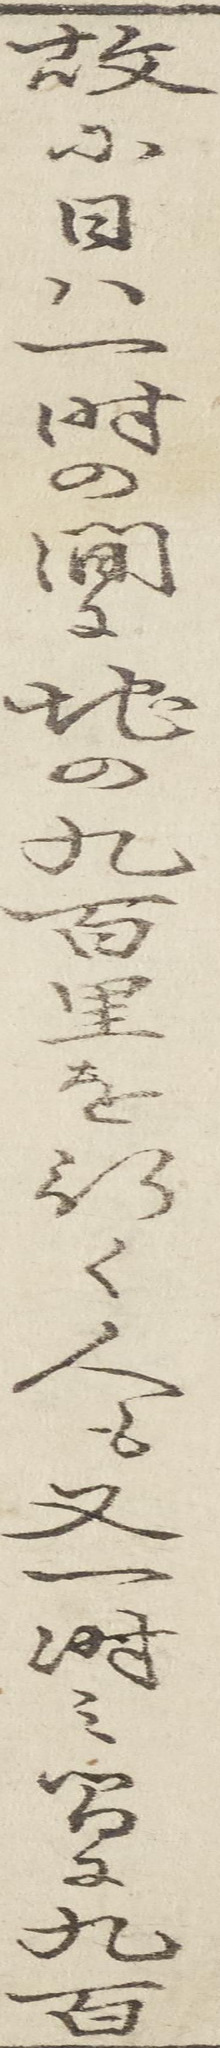故に日は一時の間に地の九百里を行く人も又一時之間に九百
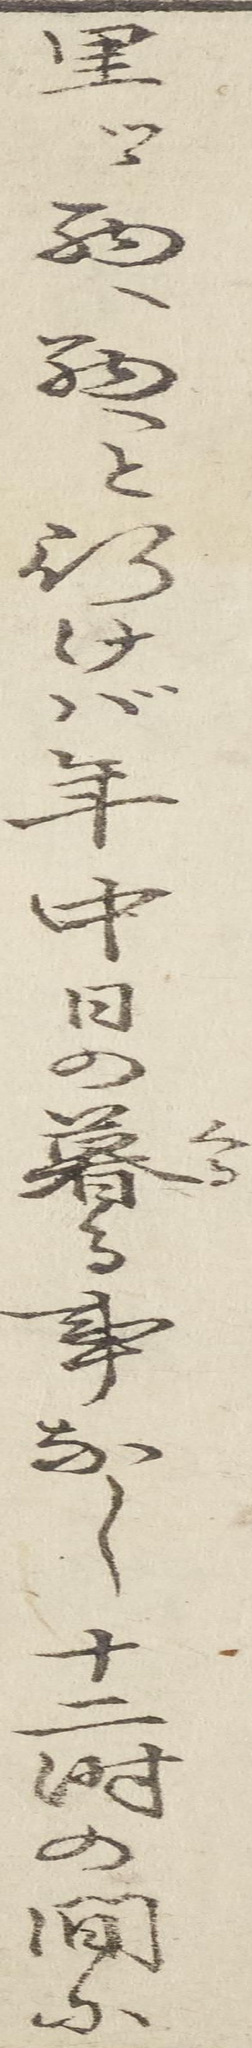里つゝ西へ西へと行けば年中日の暮る事なし十二時の間に
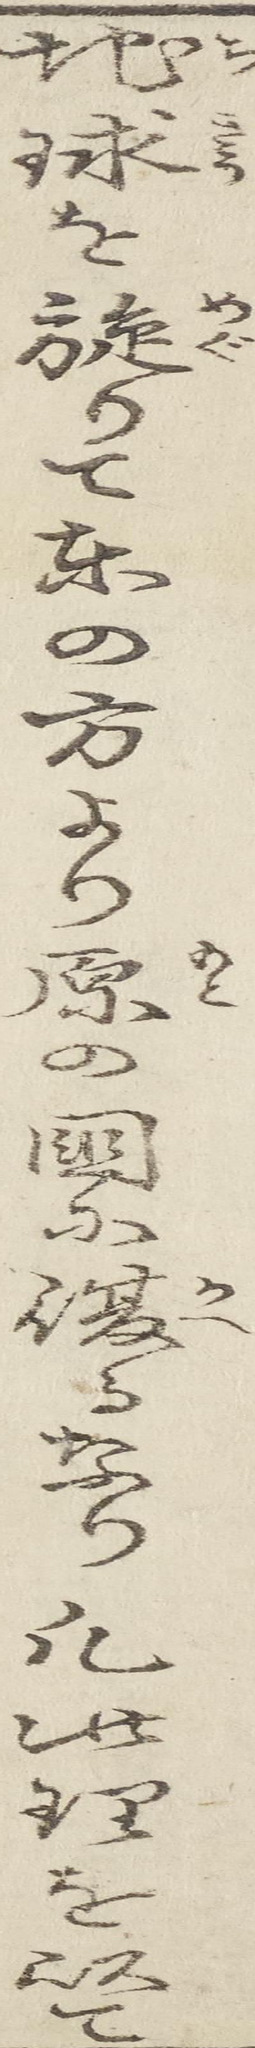地球を旋りて東の方より原の国に復るなり凡此理を以て
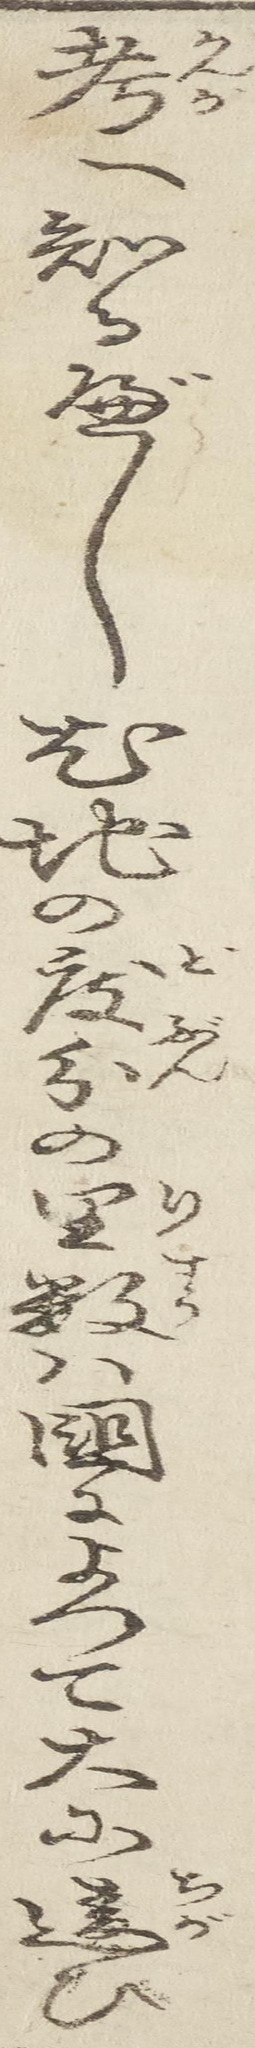考へ知るべし尤地の度分の里数は国によつて大に違ひ
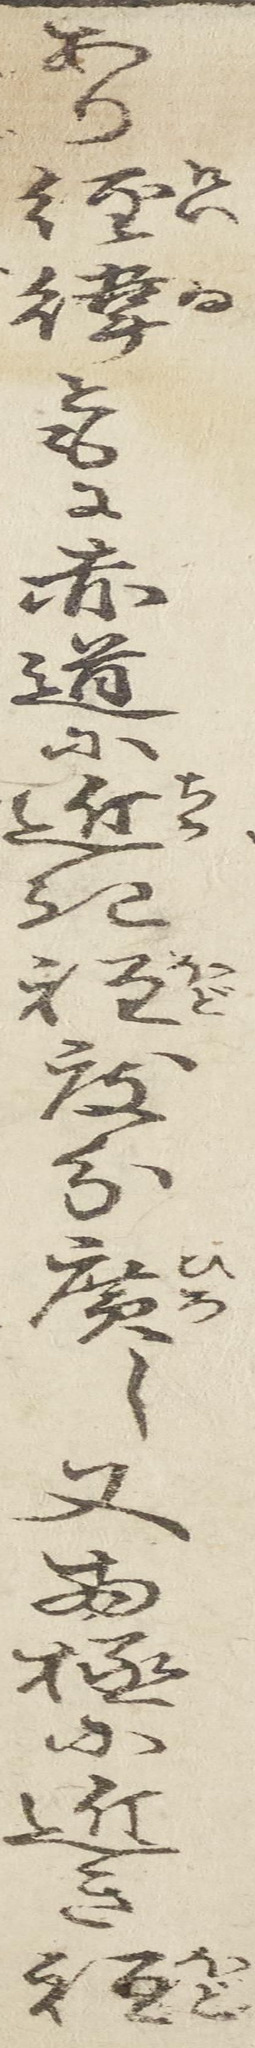あり経緯ともに赤道に近き程度分広し又南極に近き程
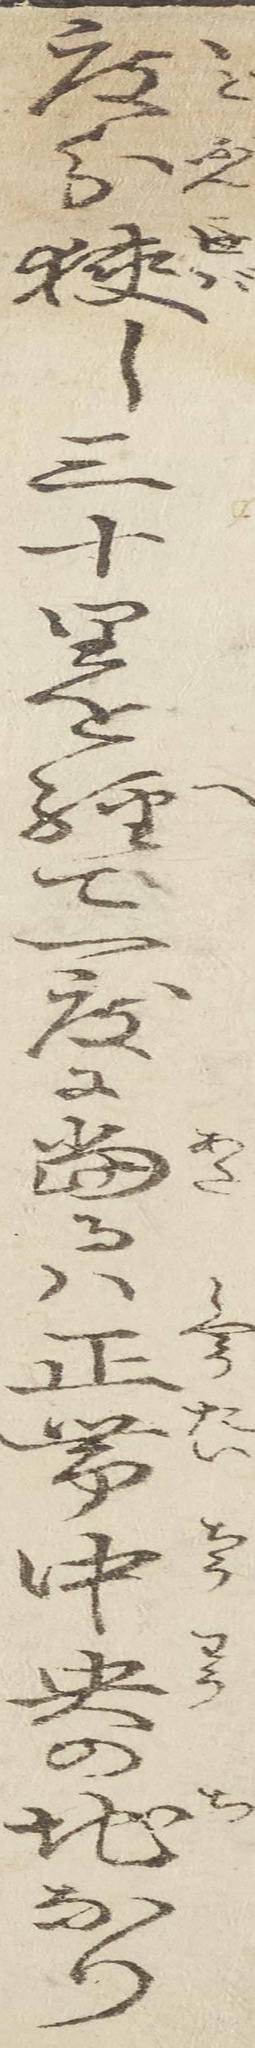度分狭し三十里を経て一度に当るは正帯中央の地なり
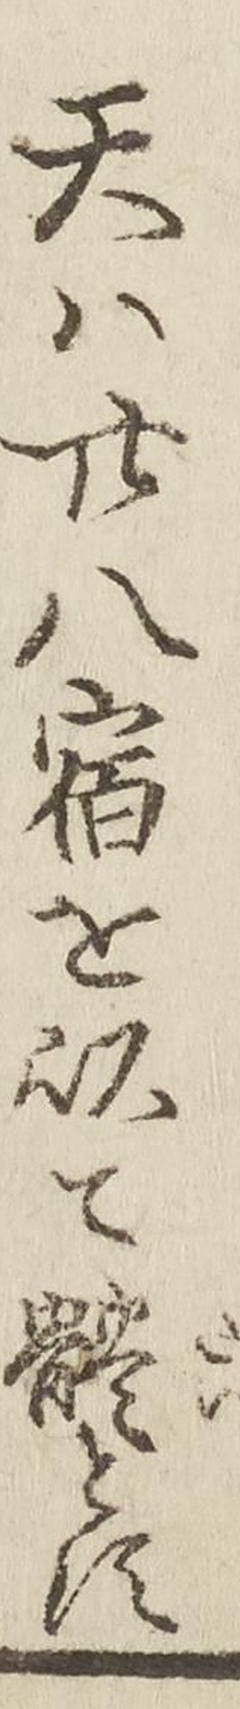天は廿八宿を以て体とす
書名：平天儀圖解
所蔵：東京大学地震研究所図書室 Earthquake Research Institute Library, The University of Tokyo, JAPAN
